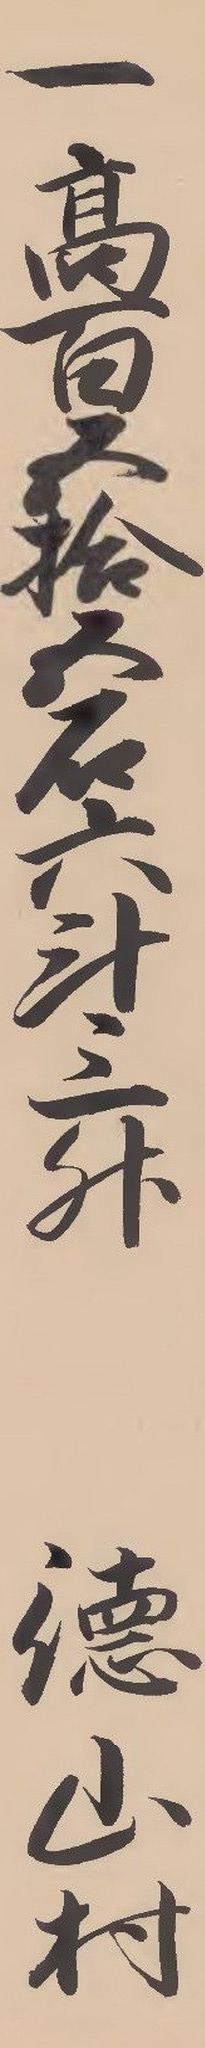一高百五拾五石六斗三升徳山村
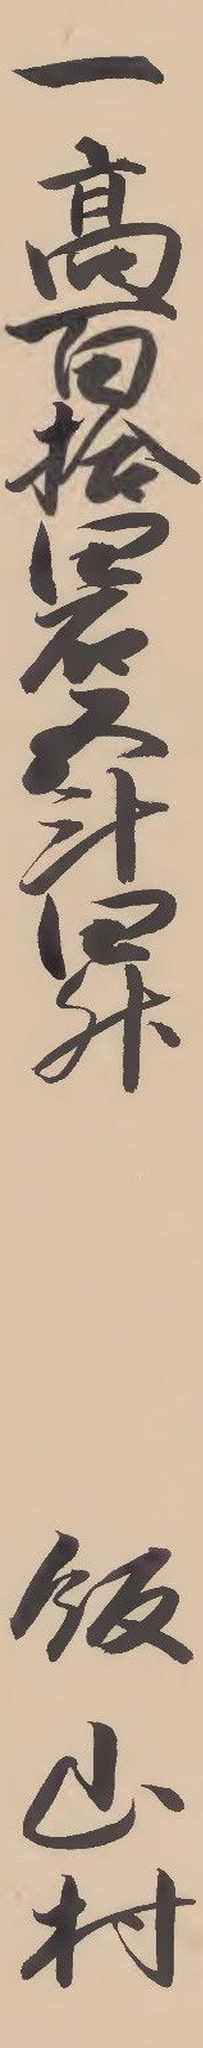一高百拾四石五斗四升飯山村
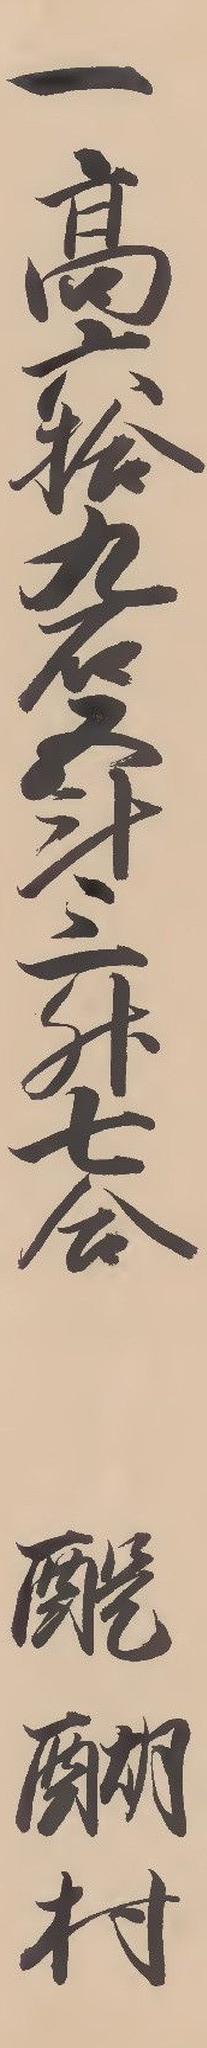一高六拾九石五斗三升七合醍醐村
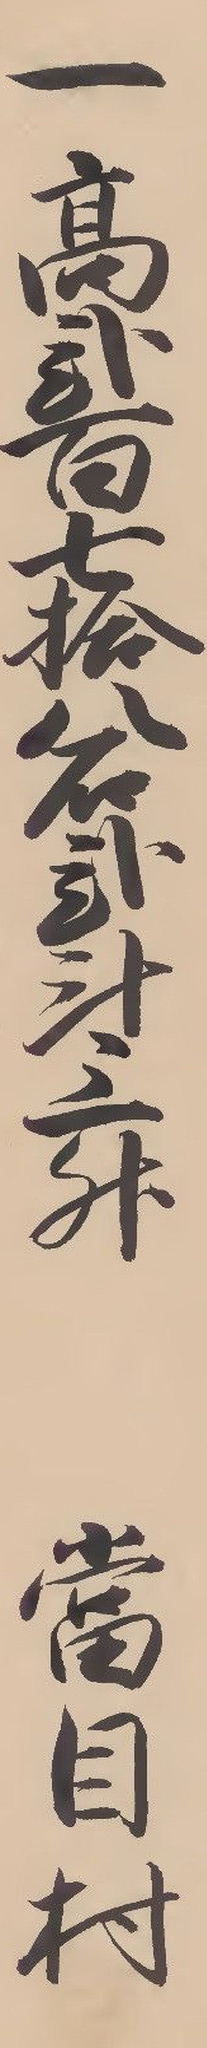一高弐百七拾八石弐斗三升当目村

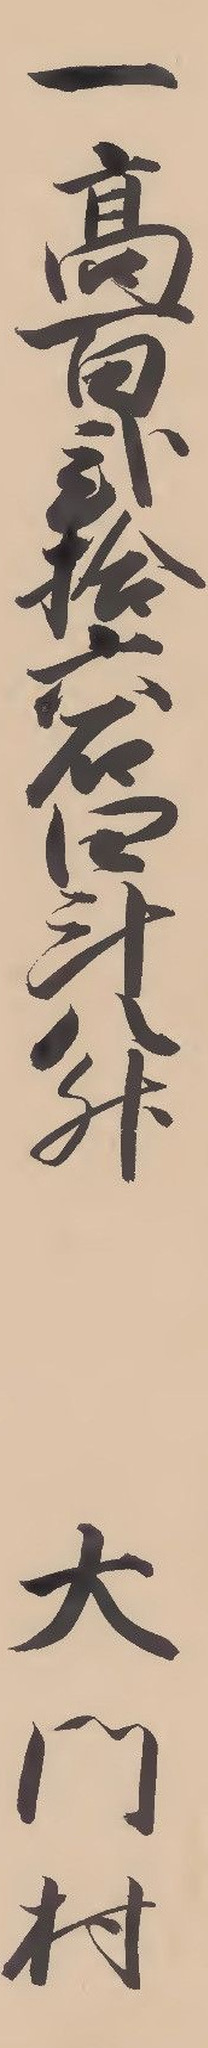一高百弐拾六石四斗八升大門村
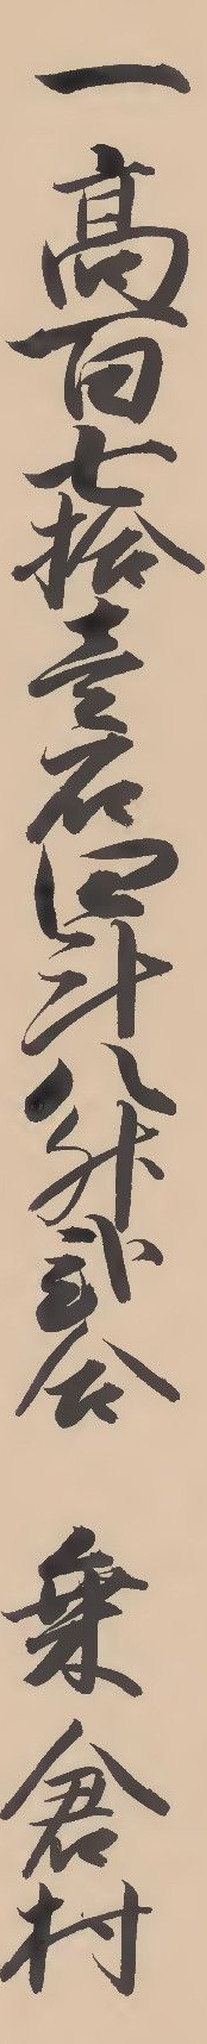一高百七拾壱石四斗八升弐合乗倉村
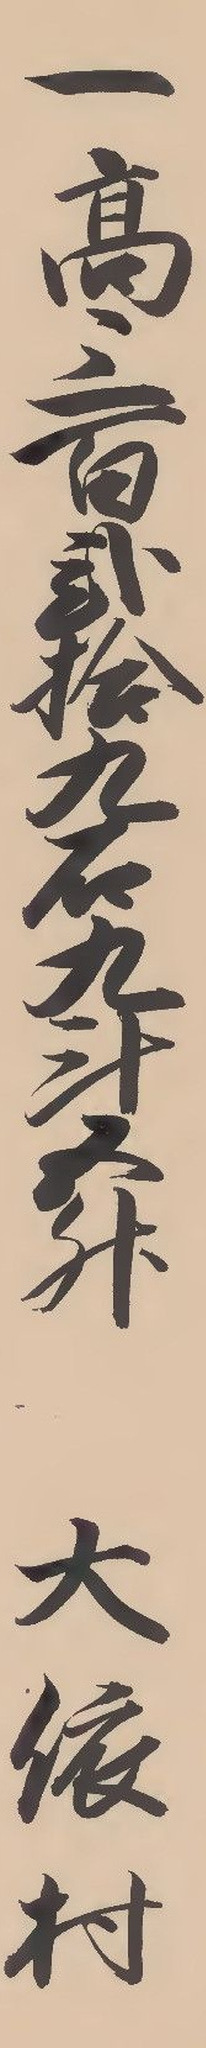一高三百弐拾九石九斗五升大依村
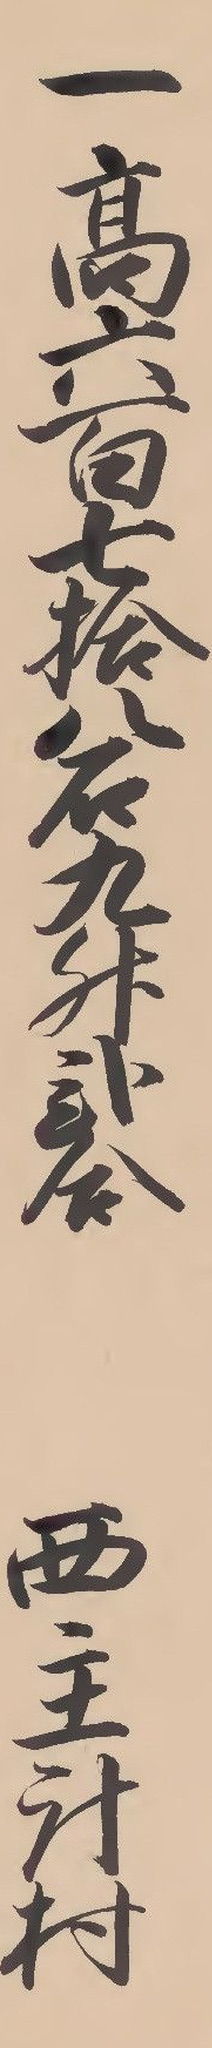一高六百七拾八石九升弐合西主計村
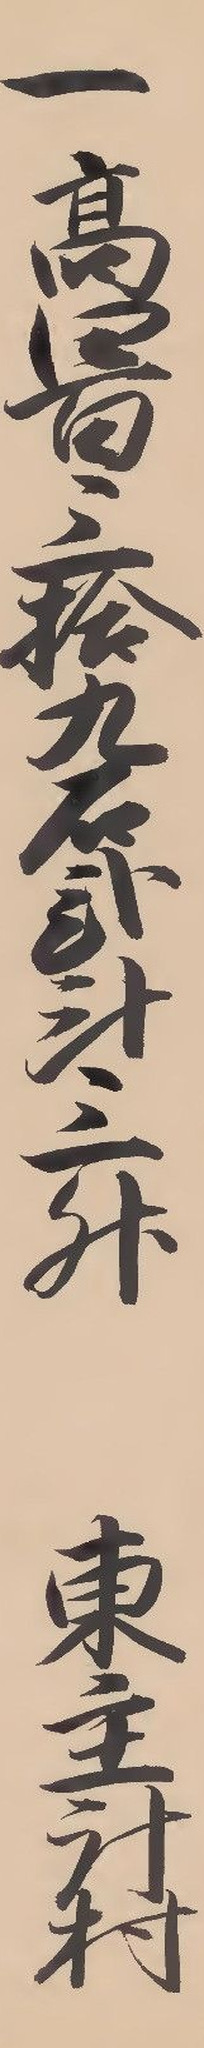一高四百三拾九石弐斗三升東主計村
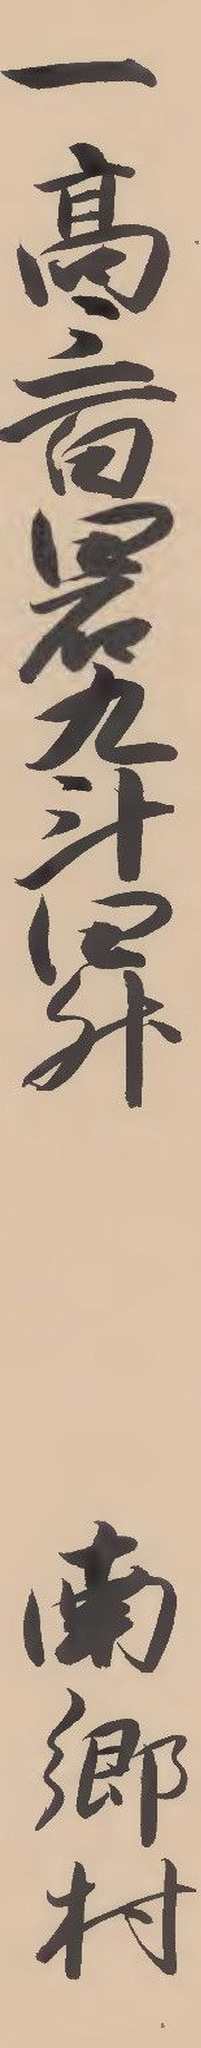一高三百四石九斗四升南郷村
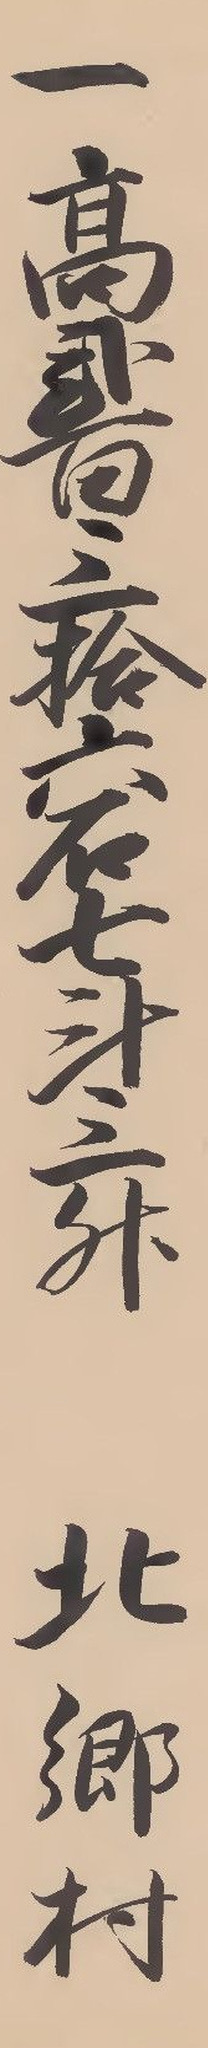一高弐百三拾六石七斗三升北郷村
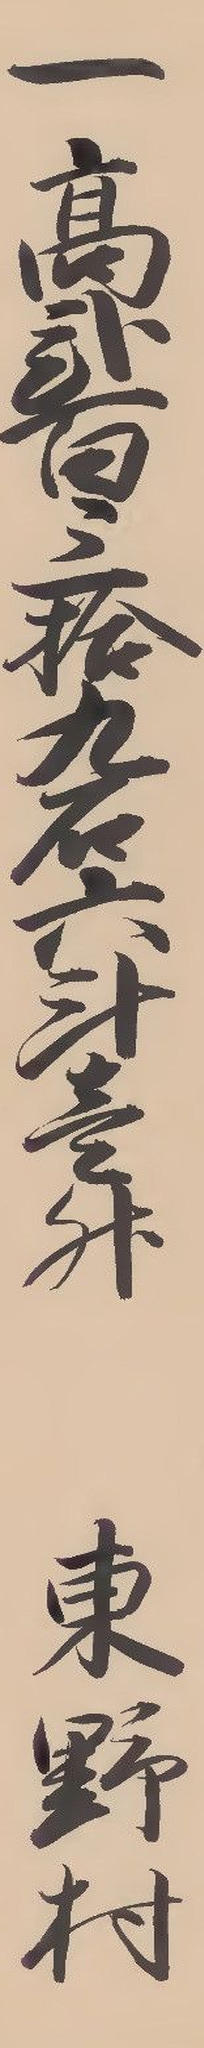一高弐百三拾九石六斗壱升東野村

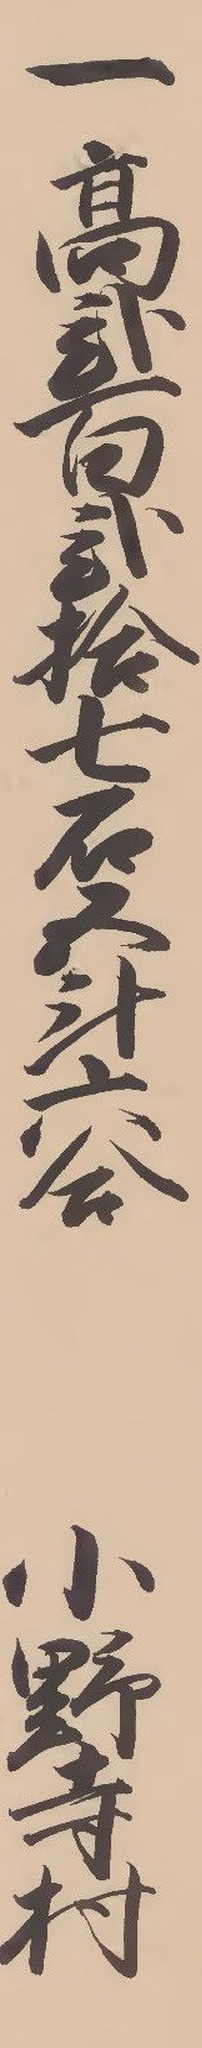一高弐百弐拾七石五斗六合小野寺村
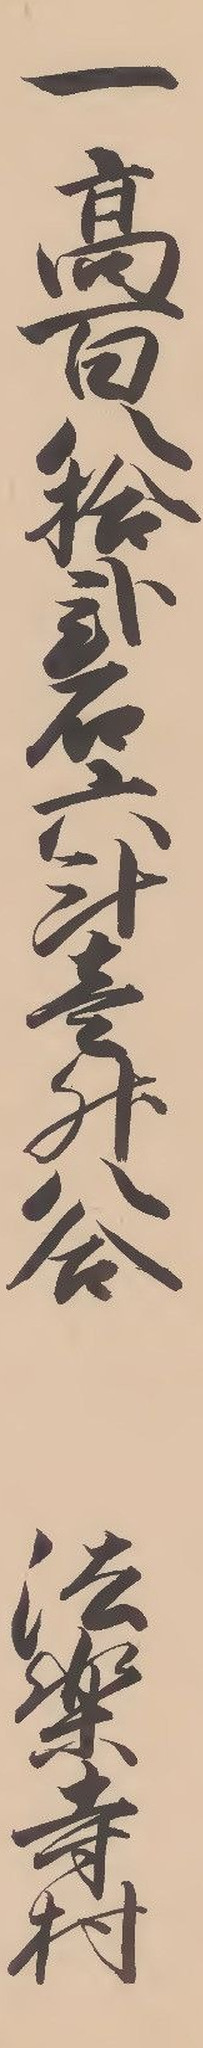一高百八拾弐石六斗壱升八合法楽寺村
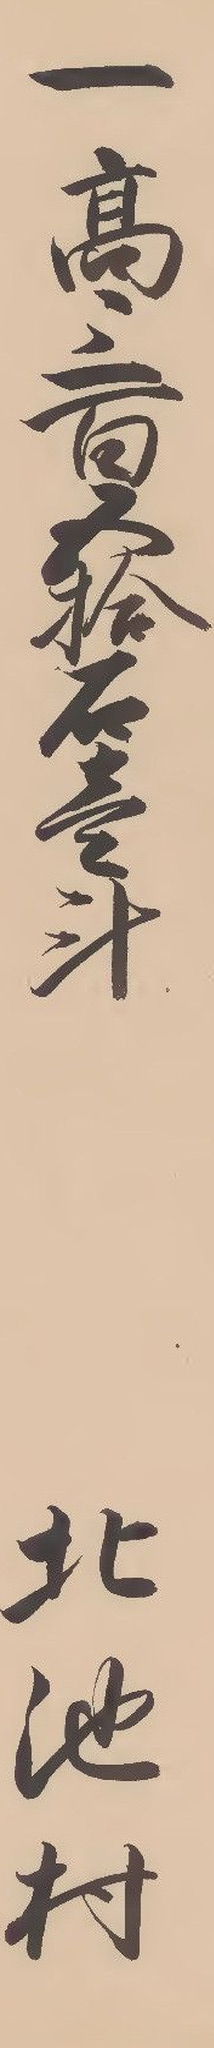一高三百五拾石壱斗北池村
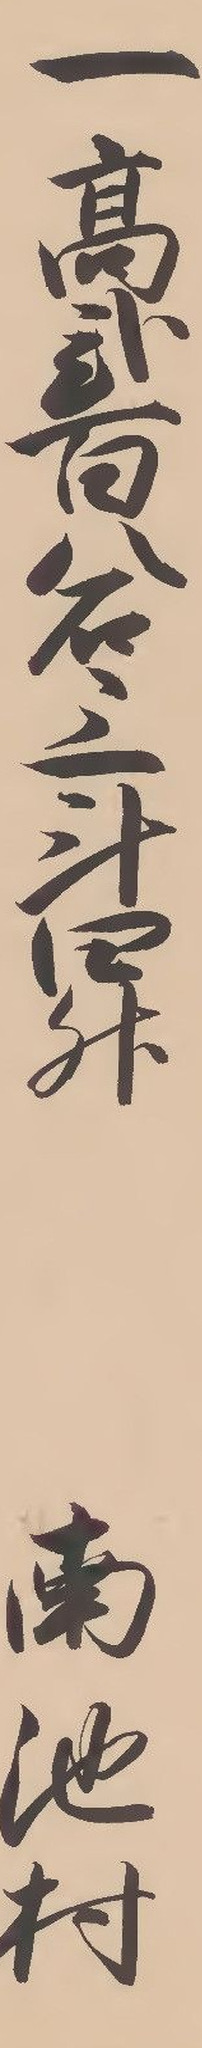一高弐百八石三斗四升南池村
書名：近江国郷帳
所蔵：国立公文書館 National Archives of Japan
